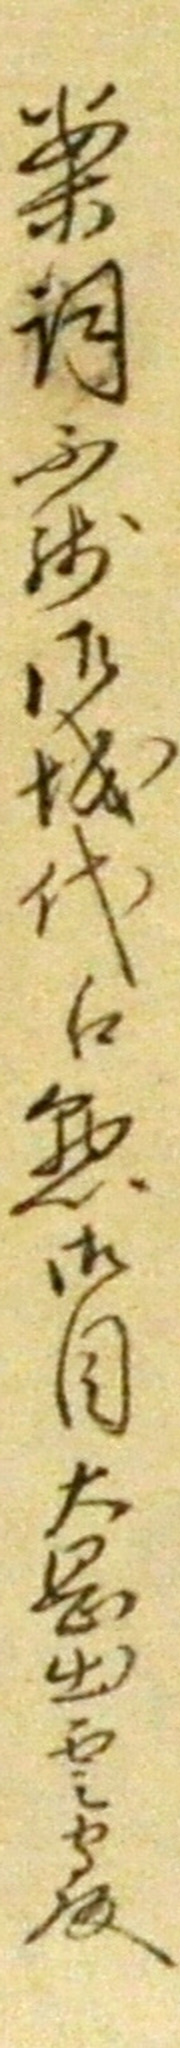案詞不残御城代え懸御目大岡出雲守殿
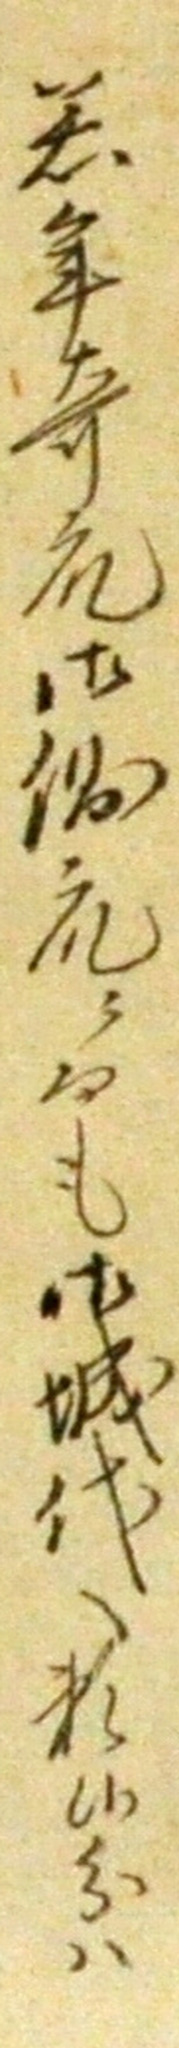若年寄衆御側衆に而も御城代ヘ頼候分は
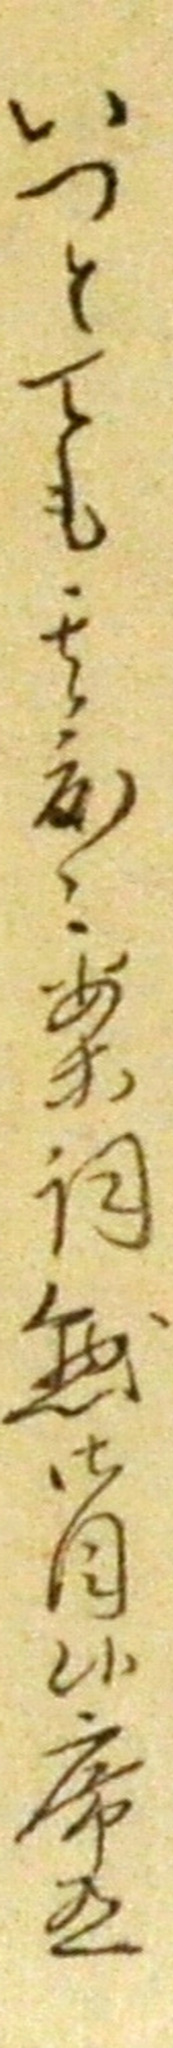いつとても其度に案詞懸御目候席有
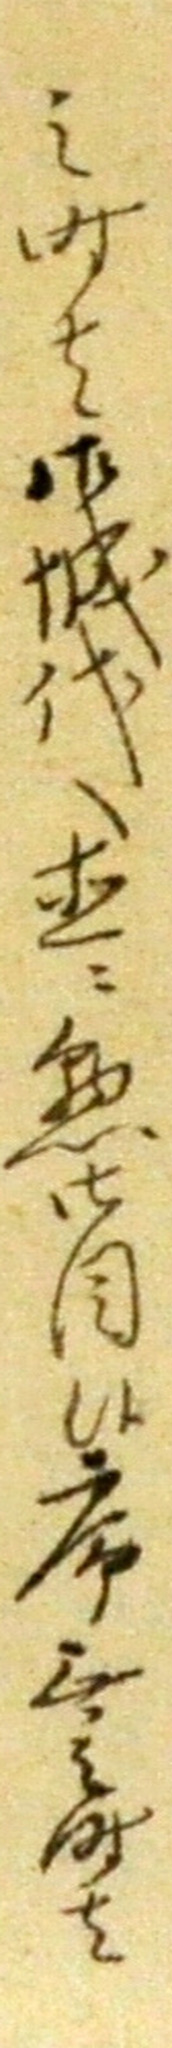之時は御城代ヘ直に懸御目候席無之時は
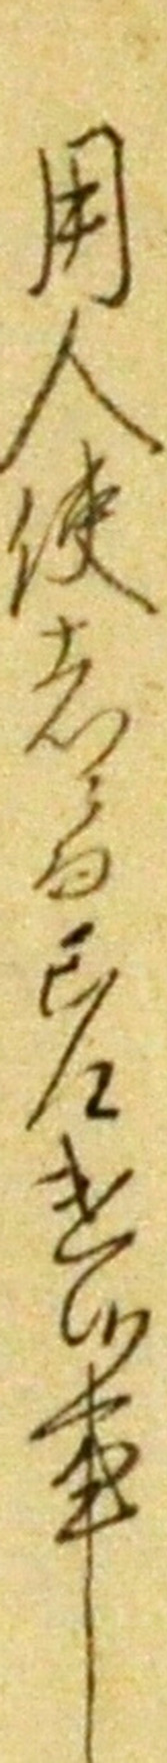用人使者に而差遣候事
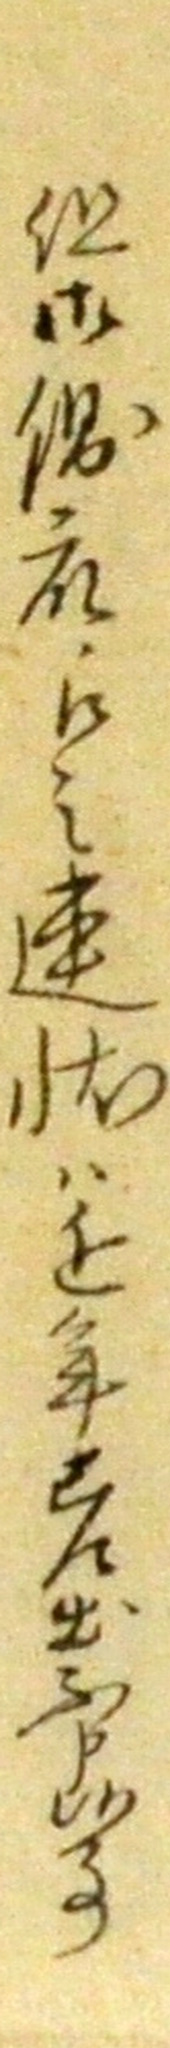但御側衆え之連状は近年差出不申候事
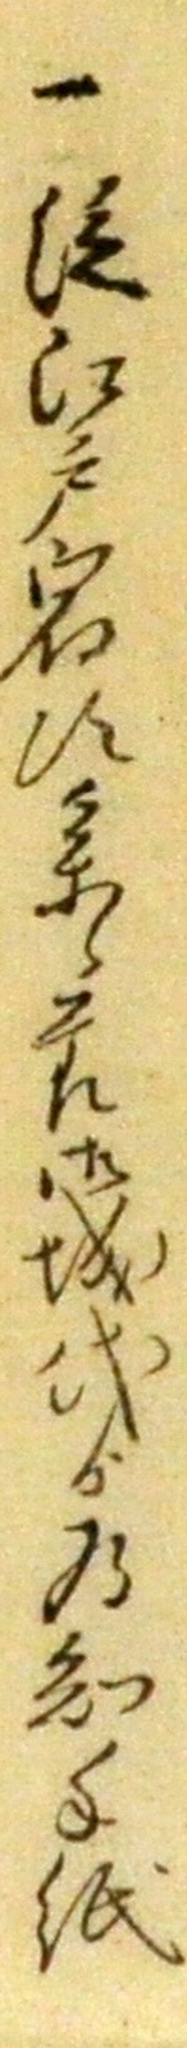一従江戸宿次参候節御城代ゟ為知手紙
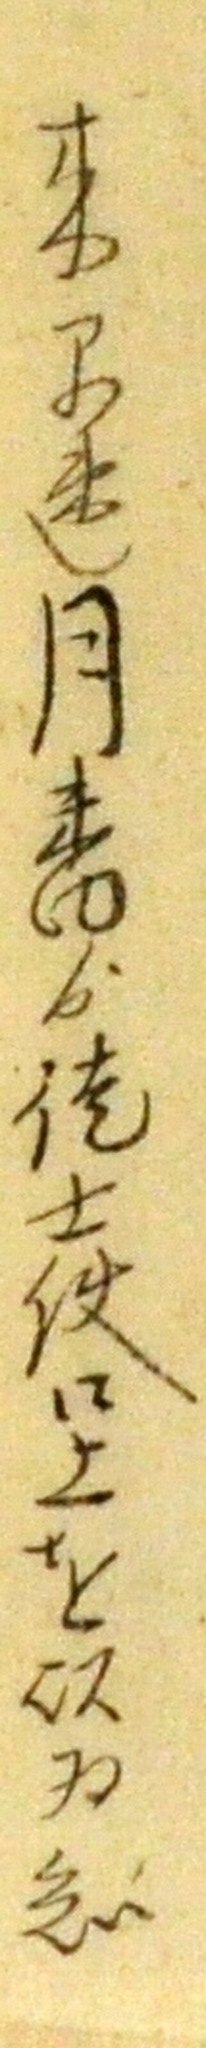来早速月番ゟ徒士使口上を以為知
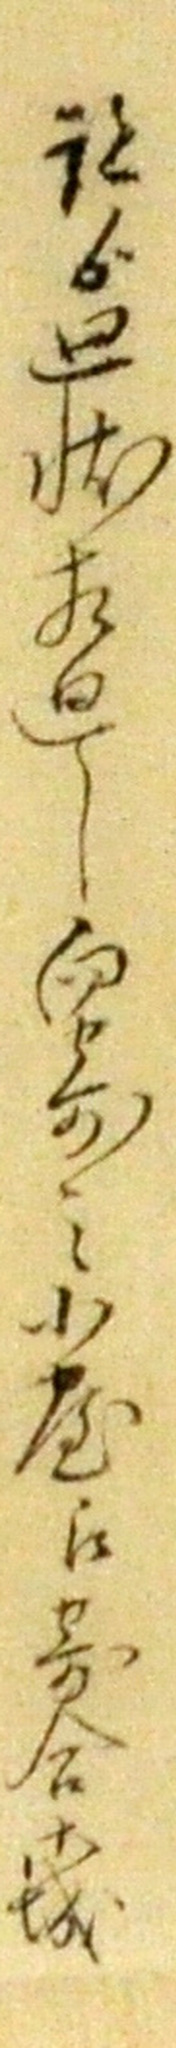跡ゟ廻状相廻し向寄之小屋え寄合御城
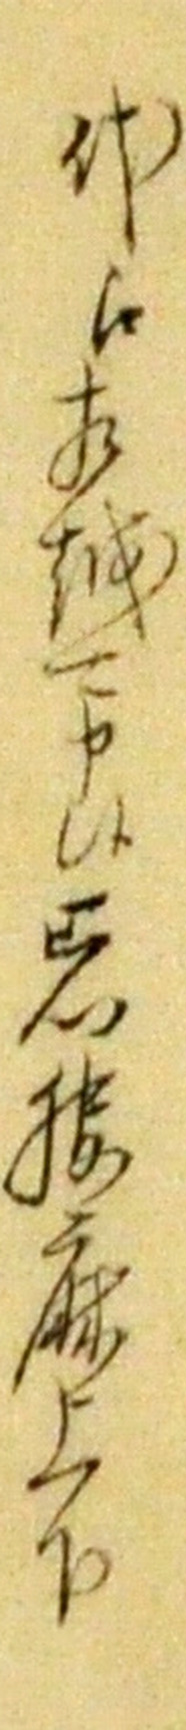代え相越可申候着服麻上下
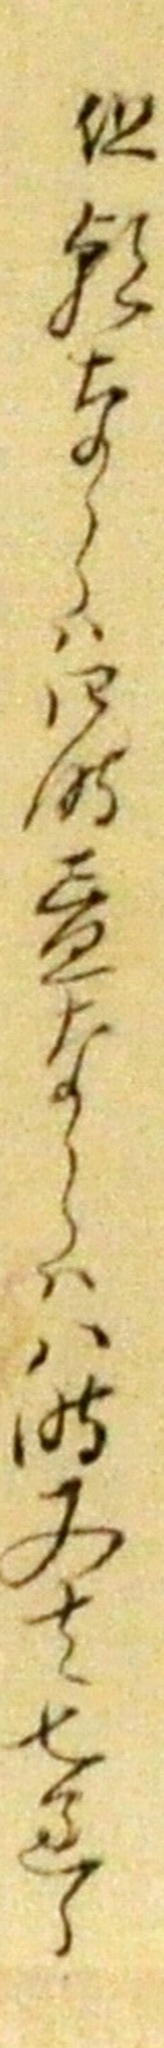但朝ならは四時昼ならは八時又は七過之
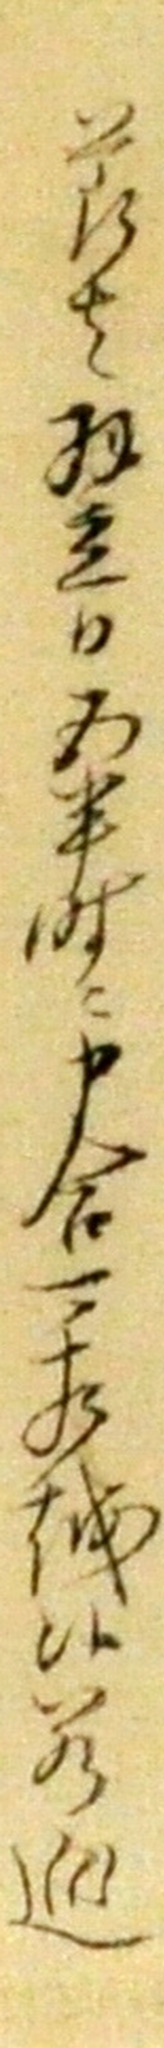節は翌日五半時に申合可相越候道巡
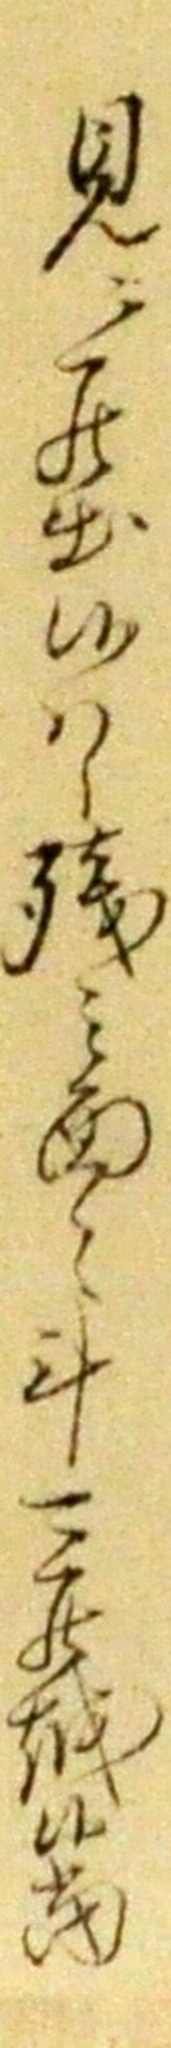見に罷出候はゝ残之面々計可罷越候当
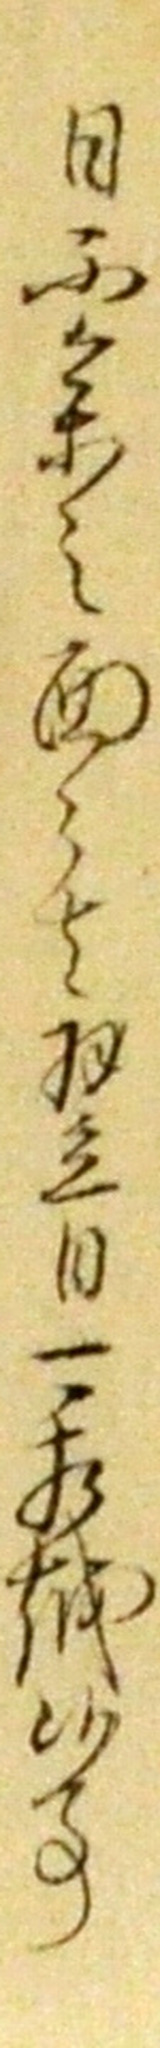日不参之面々は翌日可相越候事
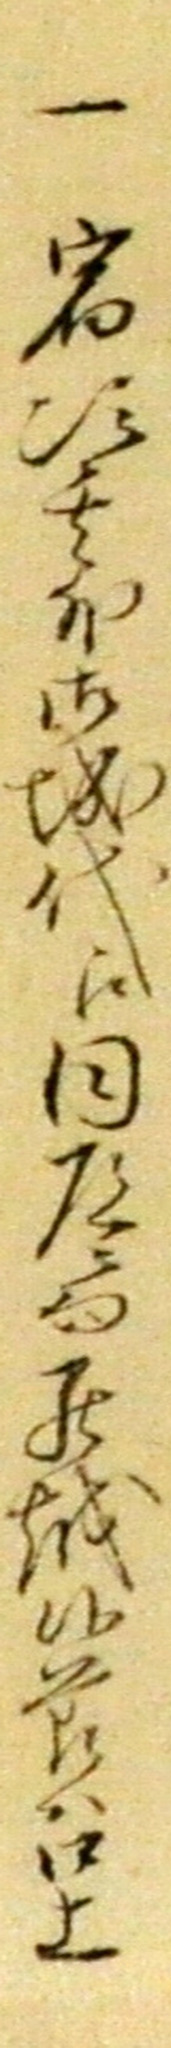一宿次其外御城代え同道に而罷越候節は口上
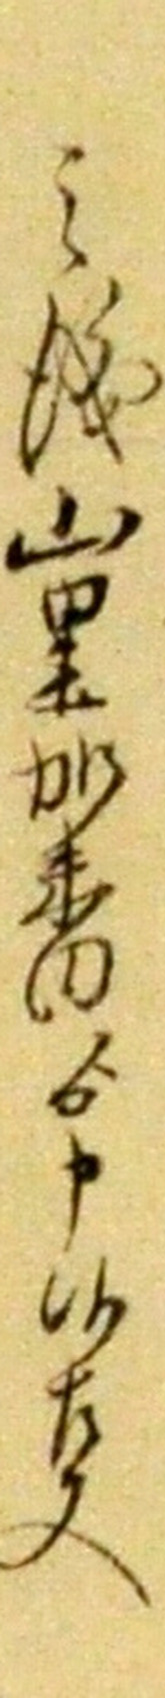之儀山里加番ゟ申候事
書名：大阪加番関係諸書留〔一括〕
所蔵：伊那市立高遠町図書館・合同会社AMANE
